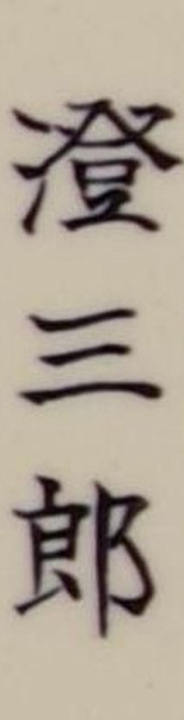澄三郎
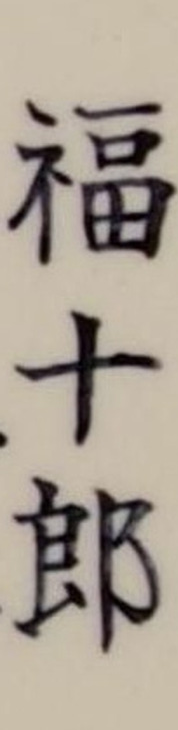福十郎
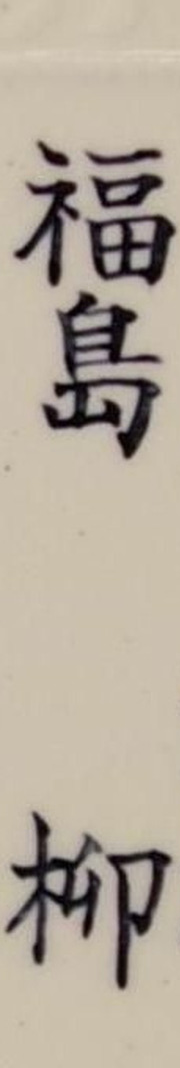福島柳
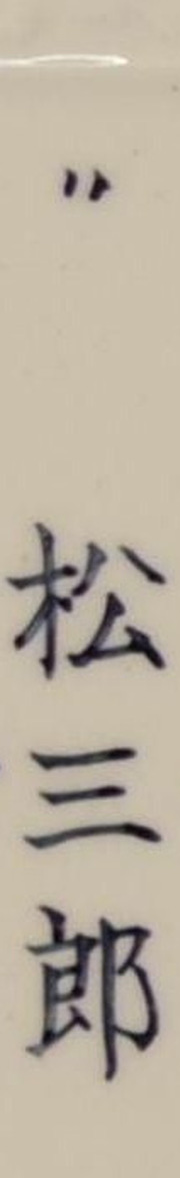松三郎
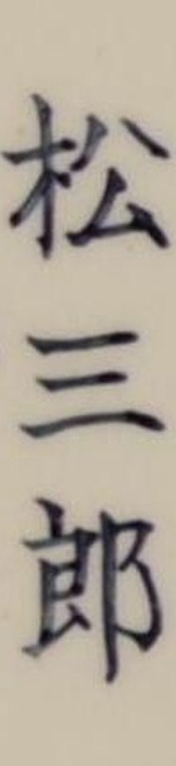松三郎
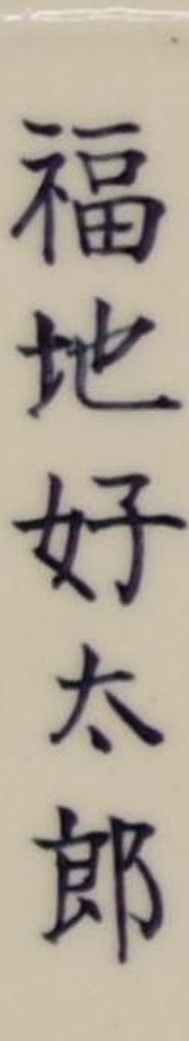福地好太郎

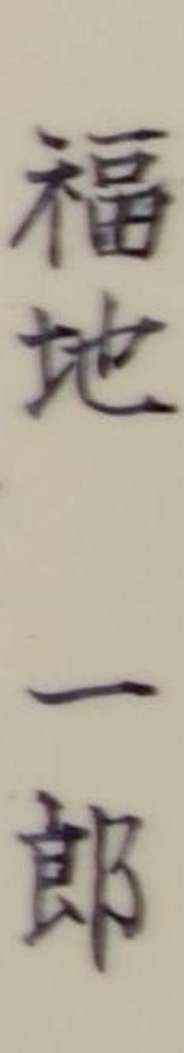福地一郎
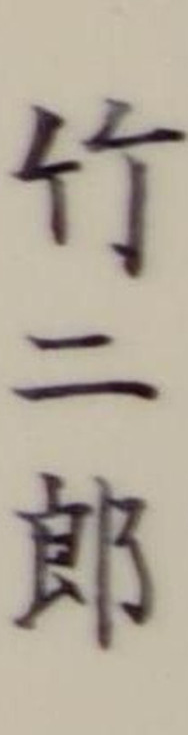竹二郎
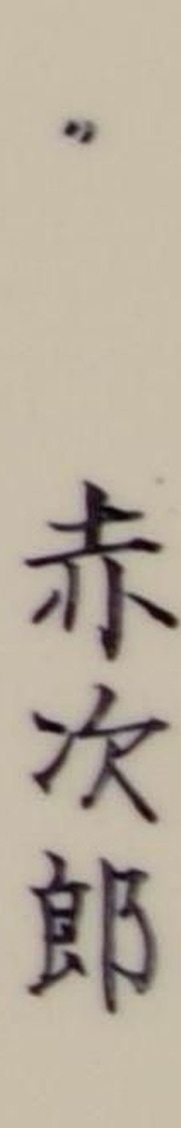赤次郎
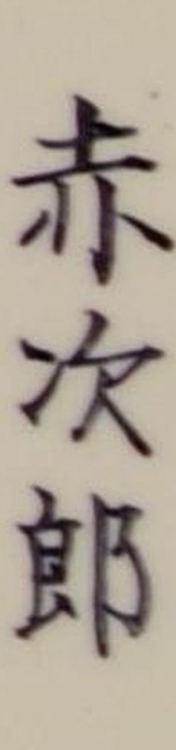赤次郎
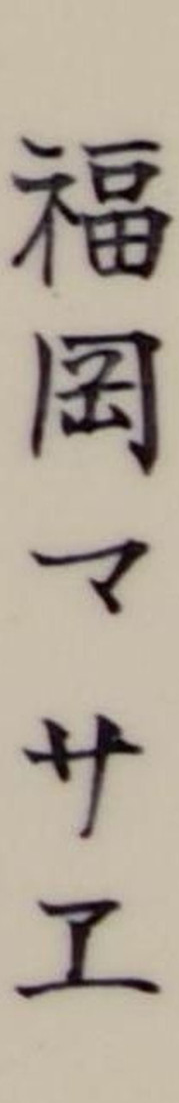福岡マサエ
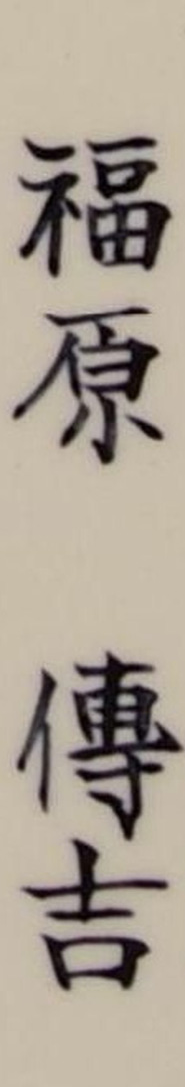福原傳吉
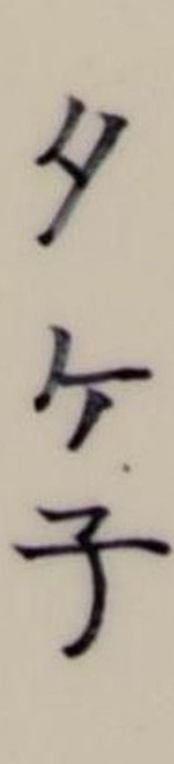タケ子
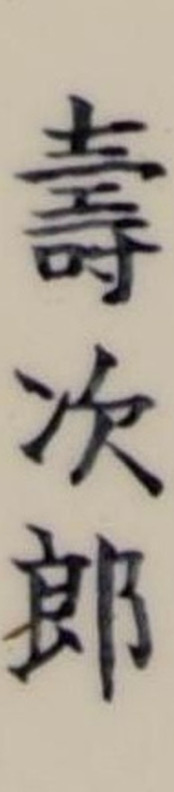赤次郎
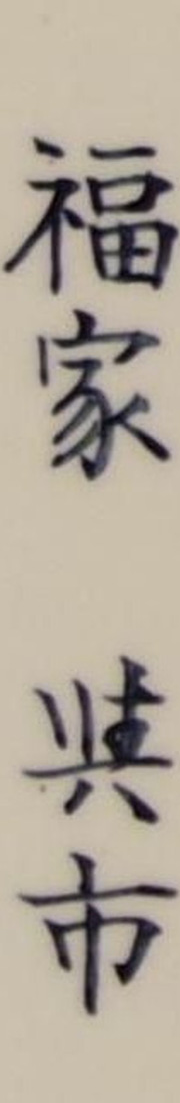福家興市

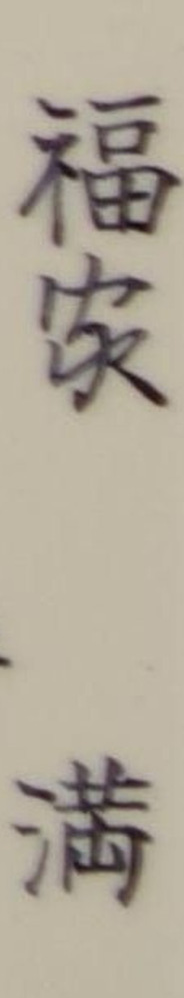福家満
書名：E~L
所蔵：高野山金剛峯寺
